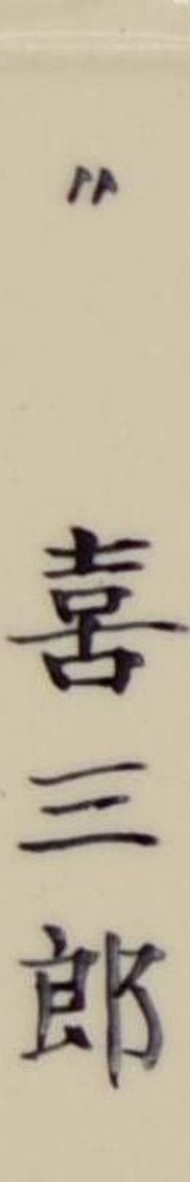喜三郎
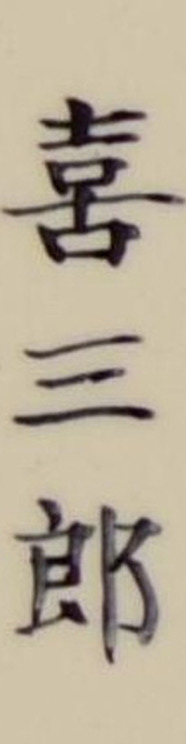喜三郎
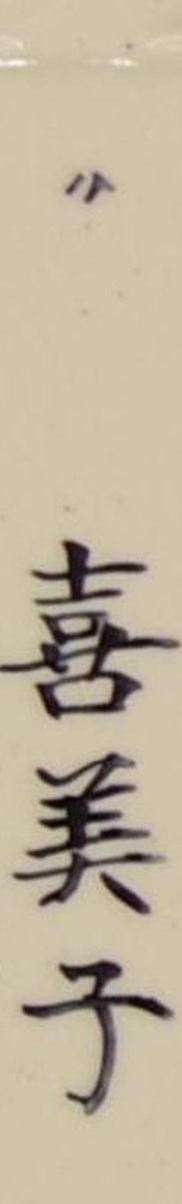喜美子
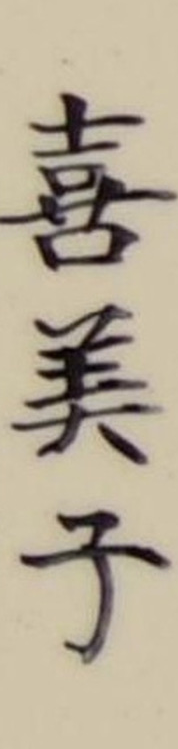喜美子
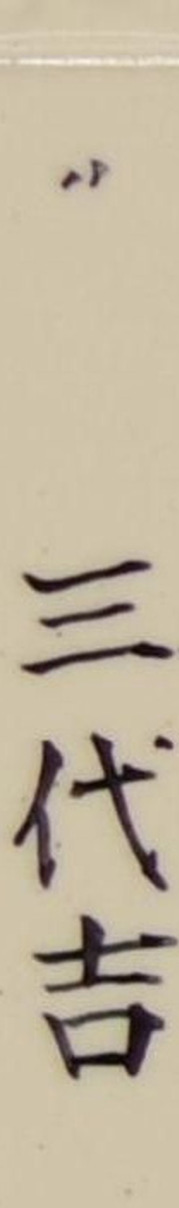三代吉
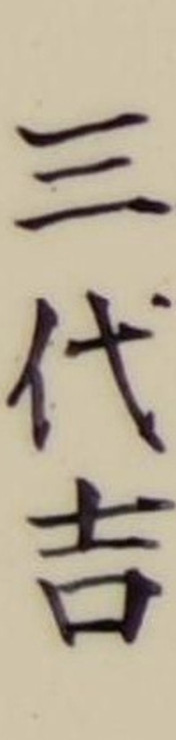三代吉
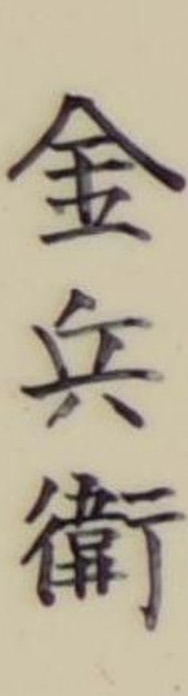金兵衛
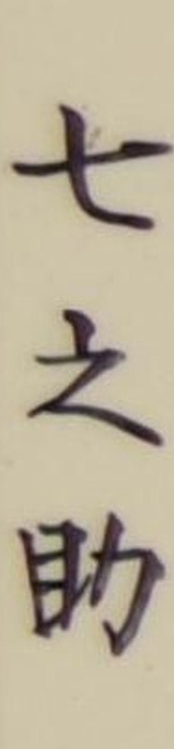七之助

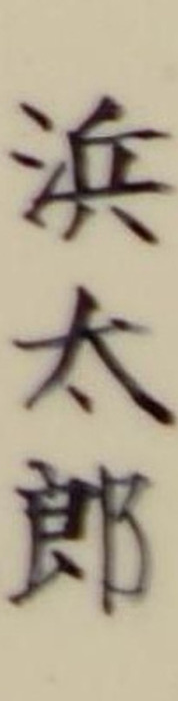浜太郎
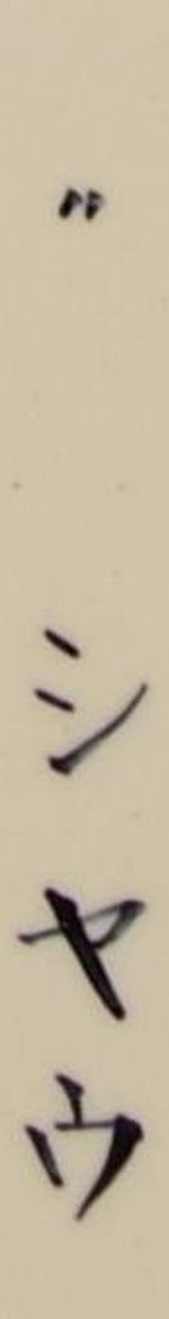シヤウ
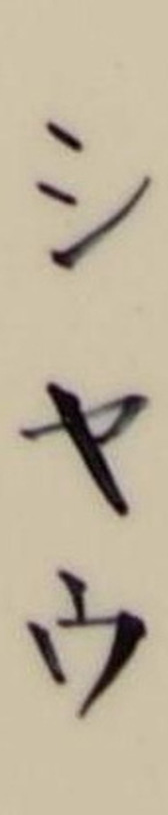シヤウ
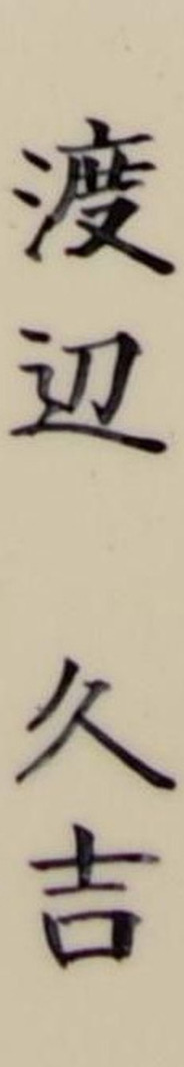渡辺久吉
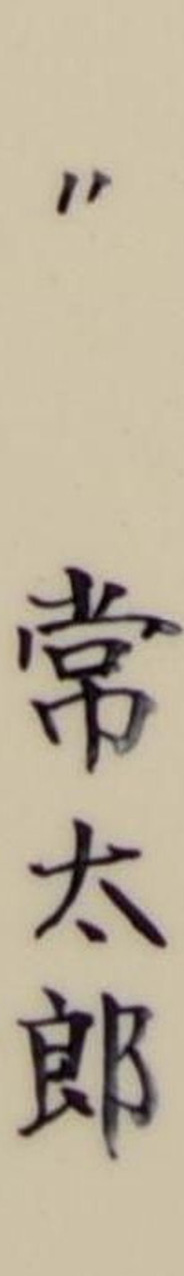常太郎
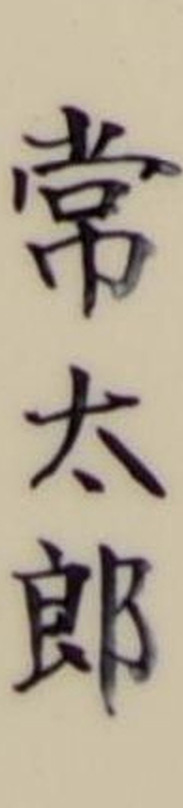常太郎
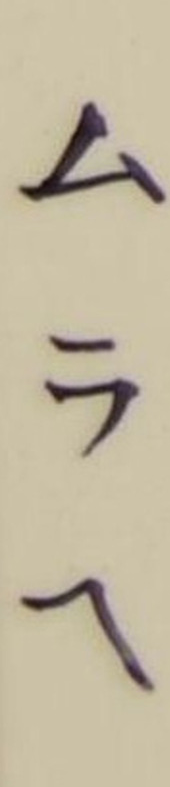ムラヘ

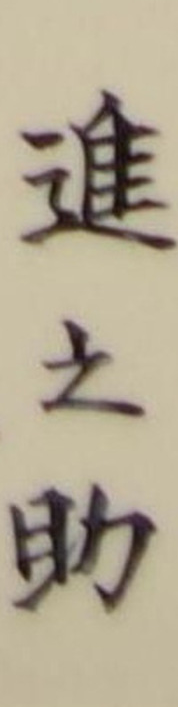進之助
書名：E~L
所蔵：高野山金剛峯寺
